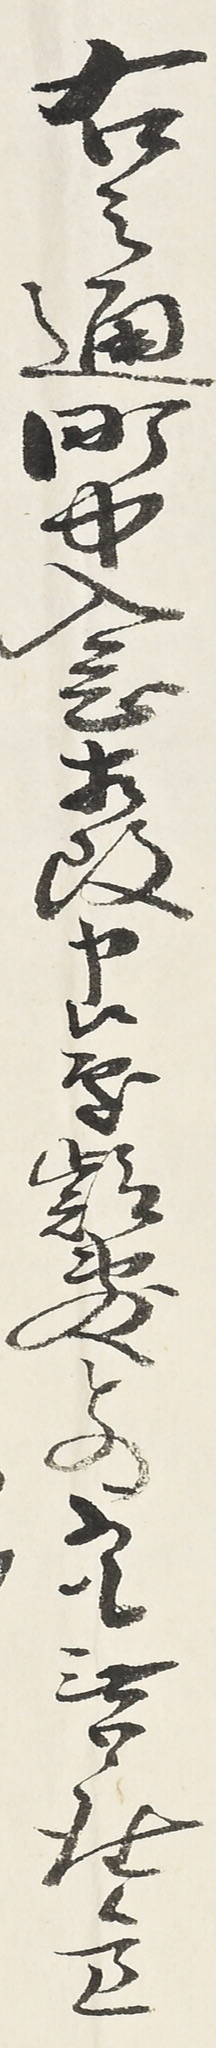右之通町中入念相改申候処疑敷もの少も無御座候万一
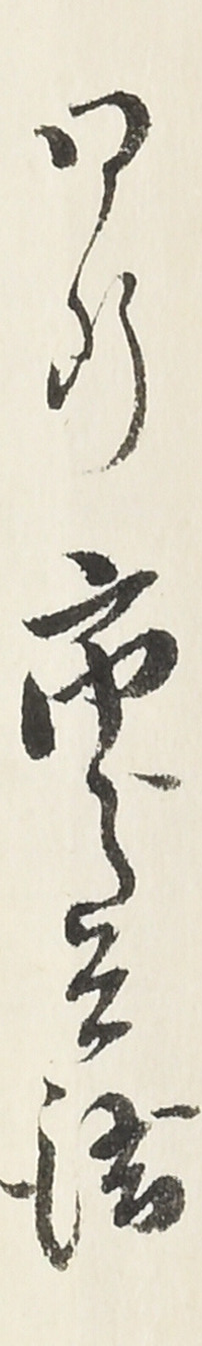同断市郎兵衛
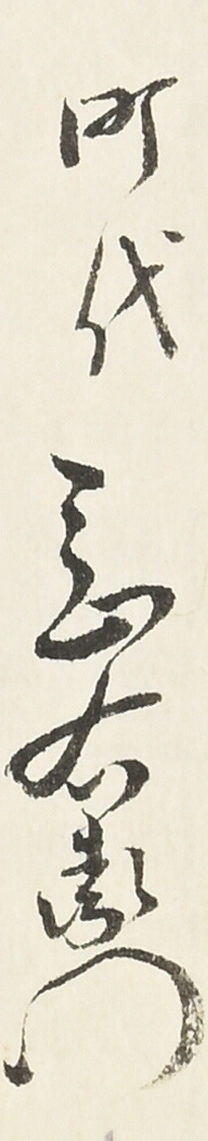町代甚右衛門
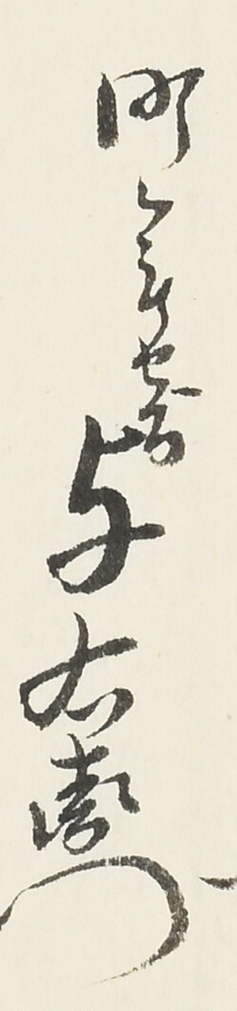町年寄与右衛門
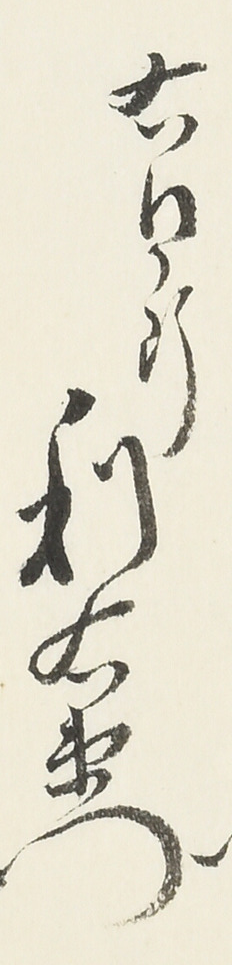右同断利右衛門
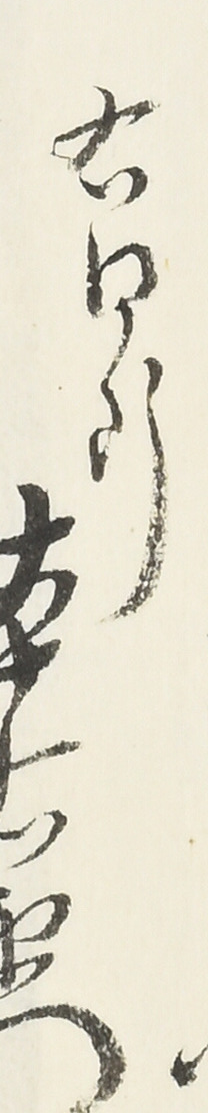右同断利右衛門
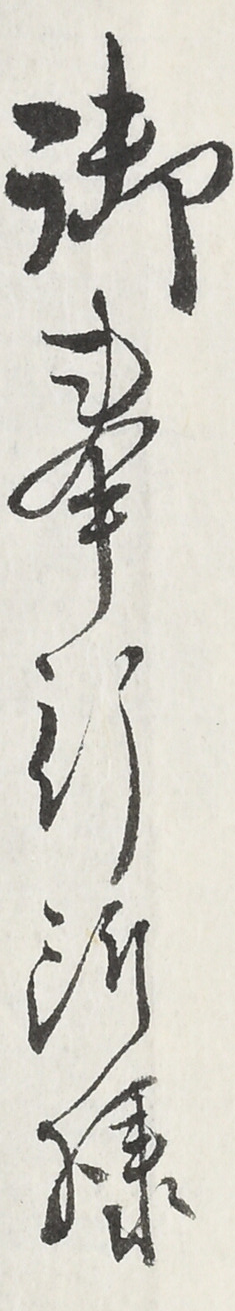御奉行所様
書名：差上申一札之事
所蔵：伊那市立高遠町図書館・合同会社AMANE
